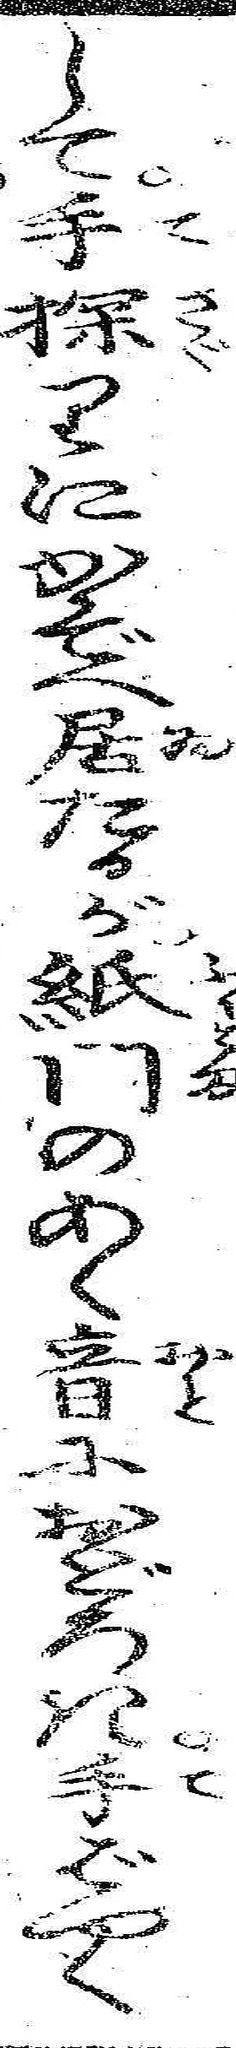して。手探りにかぞへ居たるが。紙門のあく音におどろき。手ばやく
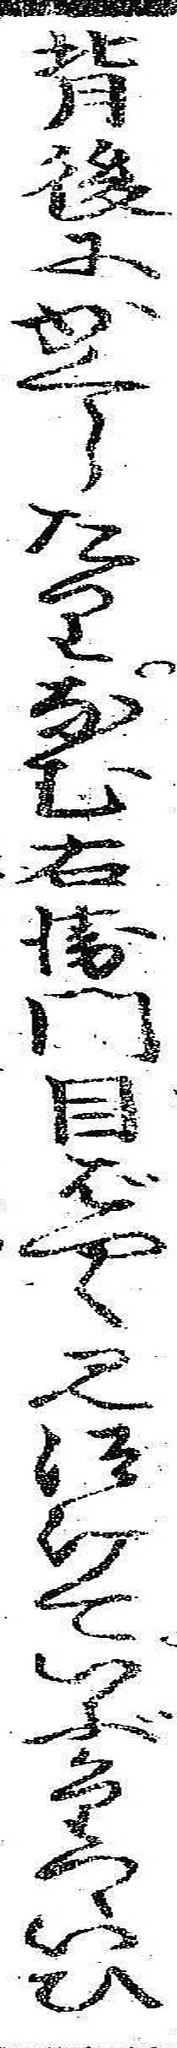背後にかくしたり。なむ右衛門目ばやく見つけて。いぶかりつゝいひ
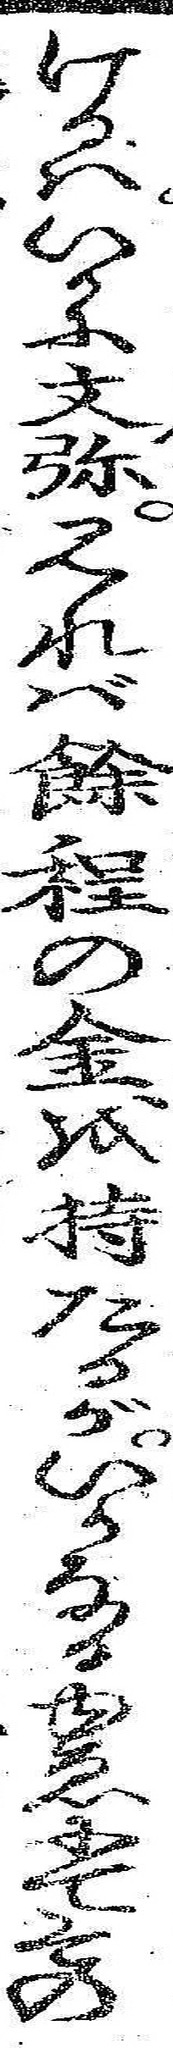けるは。いかに文弥。見れば余程の金を持たるが。いかなるゆゑにてその
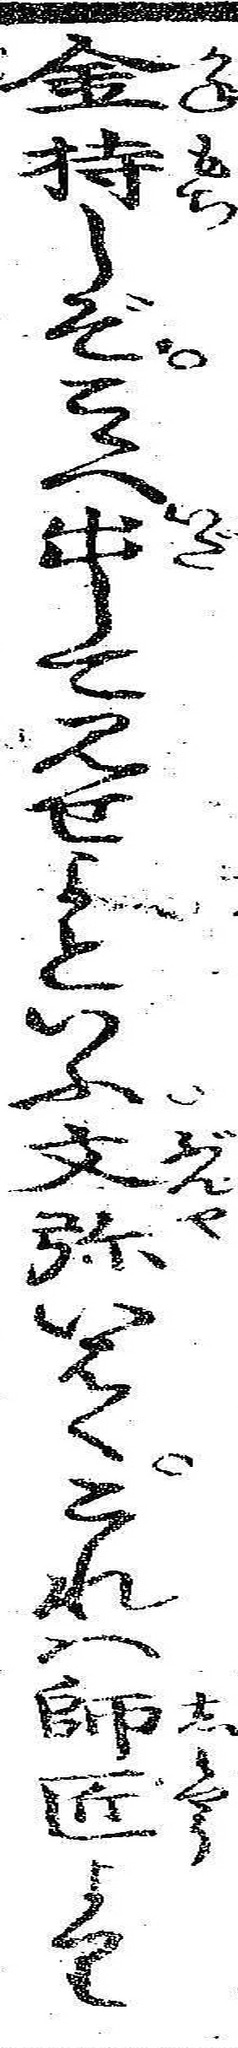金持しぞ。こゝへ出して見せよといふ。文弥いはく。これは師匠より
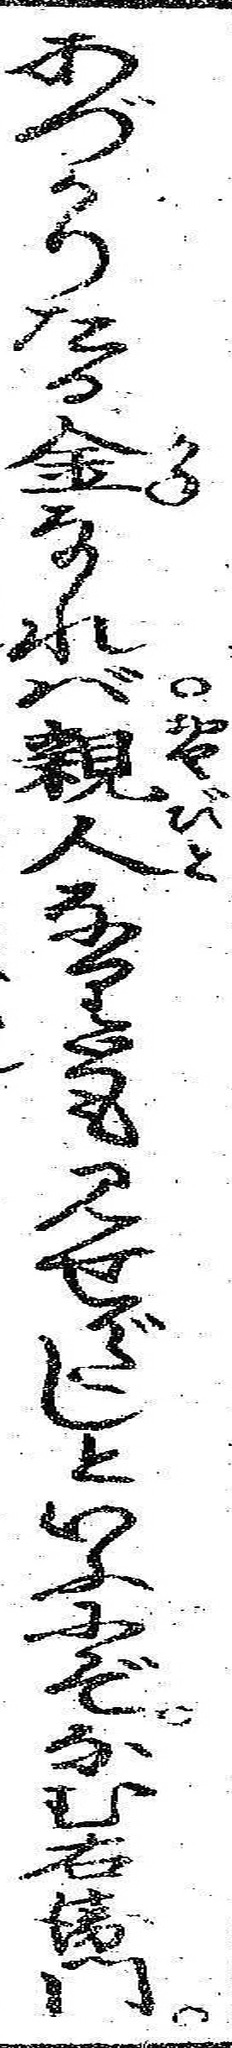あづかりたる金なれば。親人なりとも見せがたしといふにぞ。なむ右衛門。
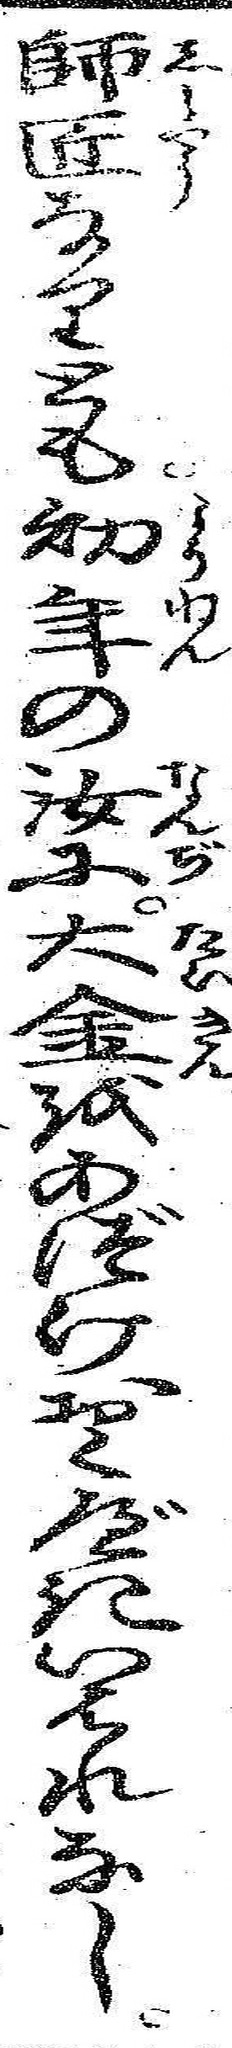師匠なりとも。幼年の汝に。大金をあづけおくべきいはれなし。
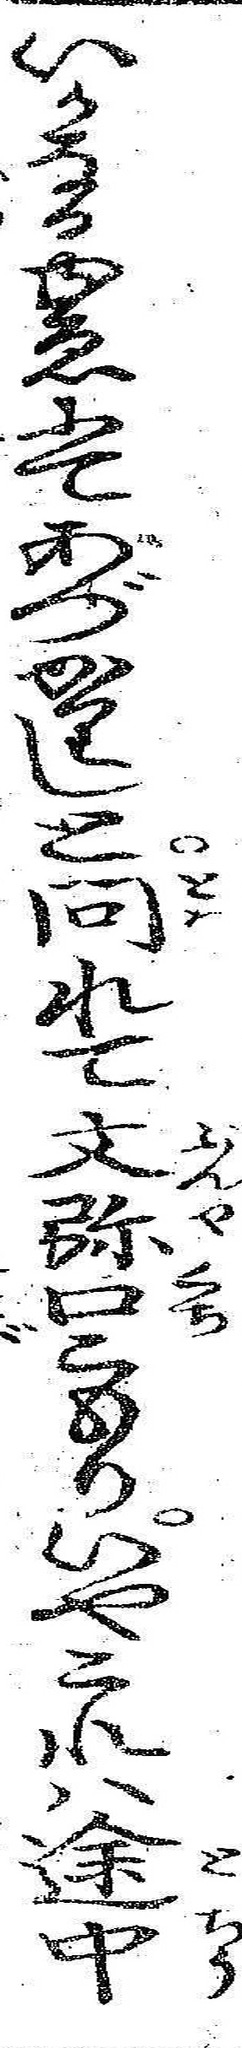いかなるゆゑにてあづかりしと。問れて文弥口こもり。いやこれは途中
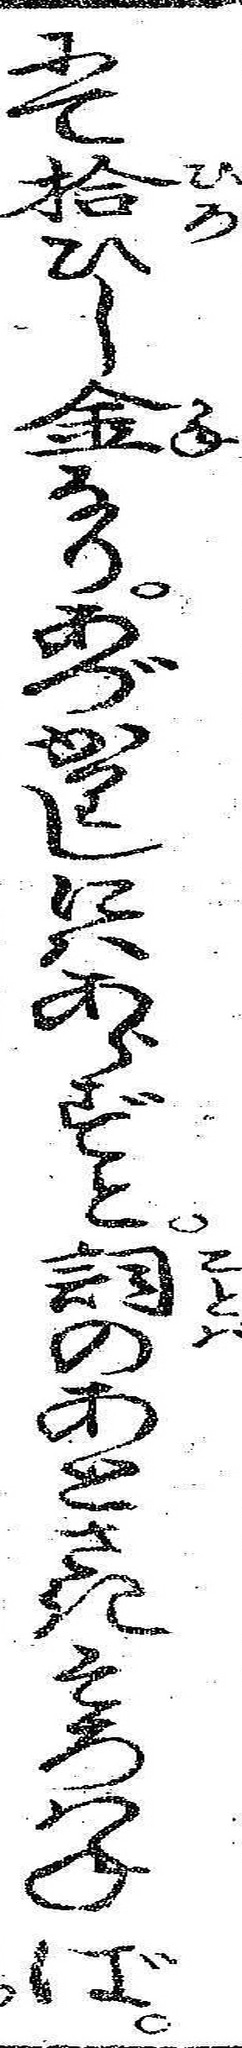にて拾ひし金なり。あづかりしにはあらずと。詞のあとさきそろはねば。
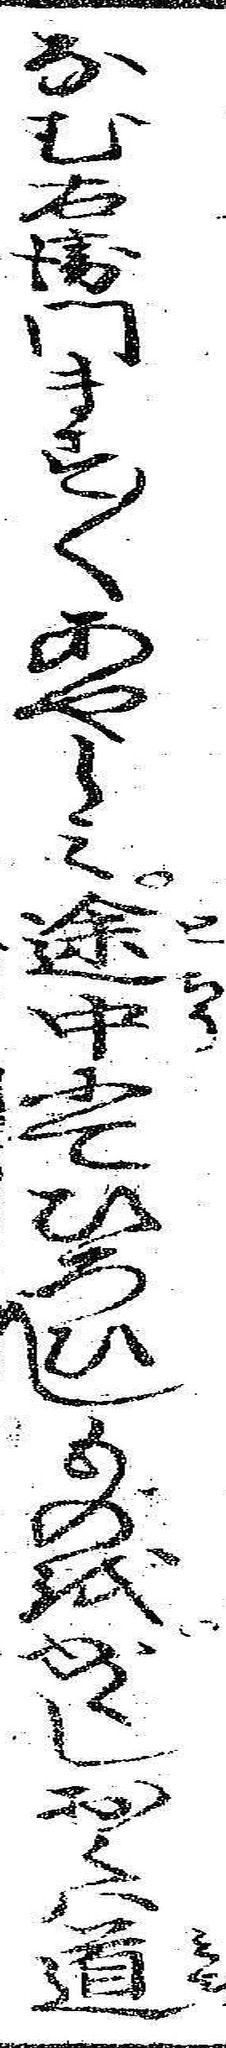なむ右衛門ます〳〵あやしみ。途中にてひろひしものを。かくしおくは道
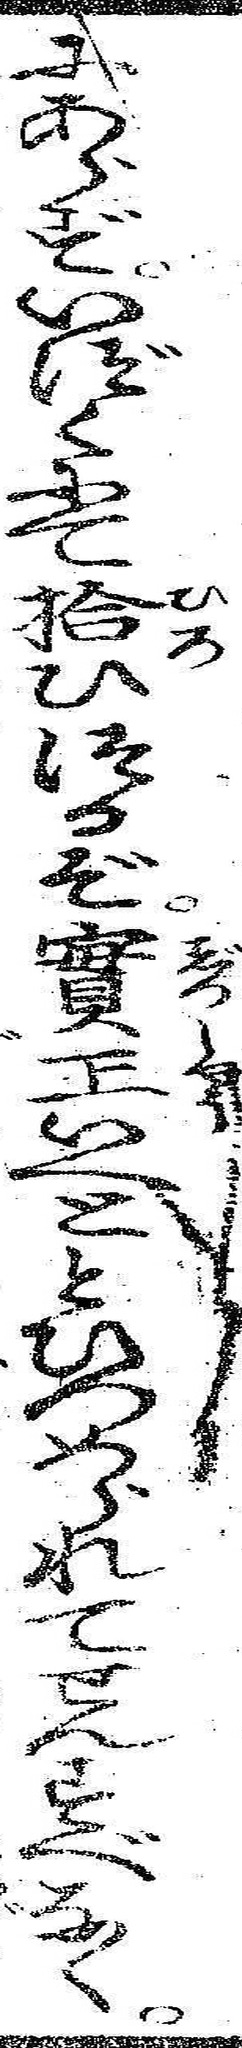にあらず。いづくにて拾ひつるぞ。実正いへととひつめられてせんすべなく。
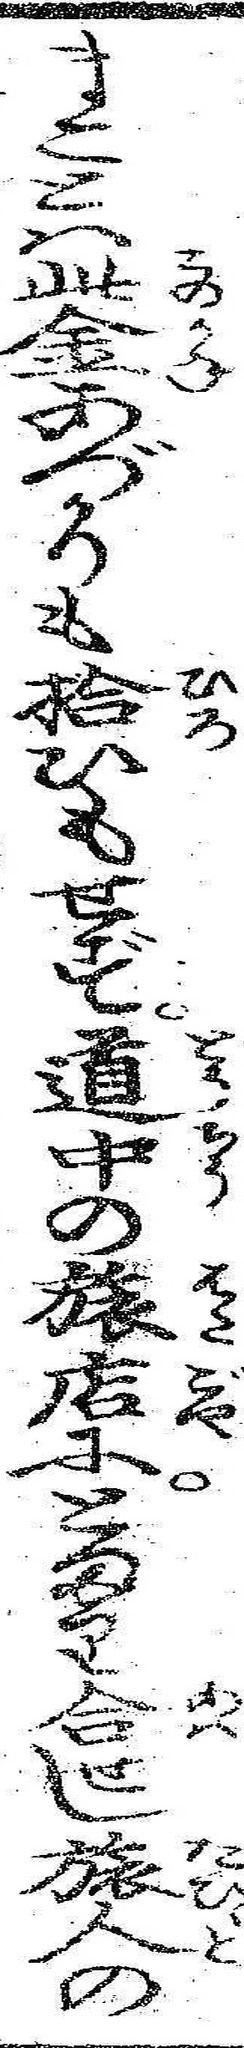まことは此金あづかりも拾ひもせず。道中の旅店に。とまり合せし旅人の
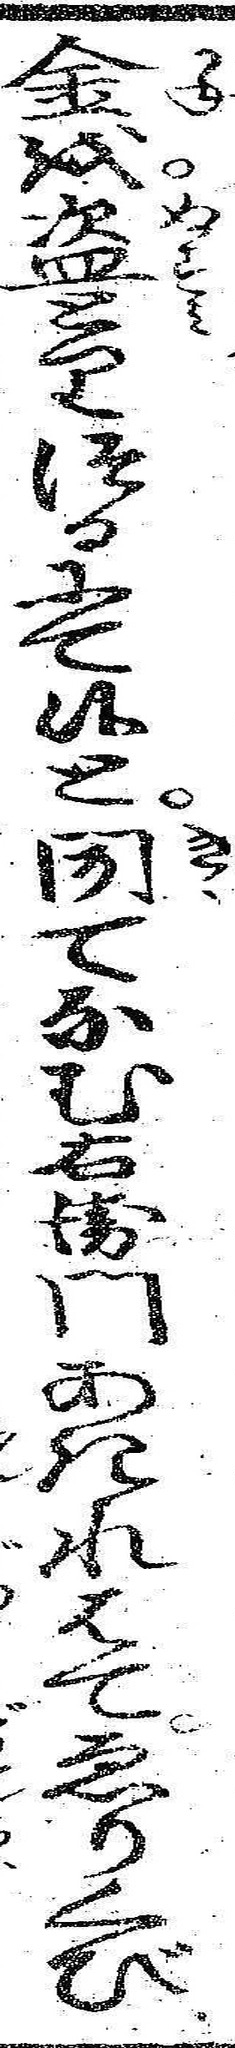金を。盗とりつるにて候と。聞てなむ右衛門あきれはて。ゑりくび
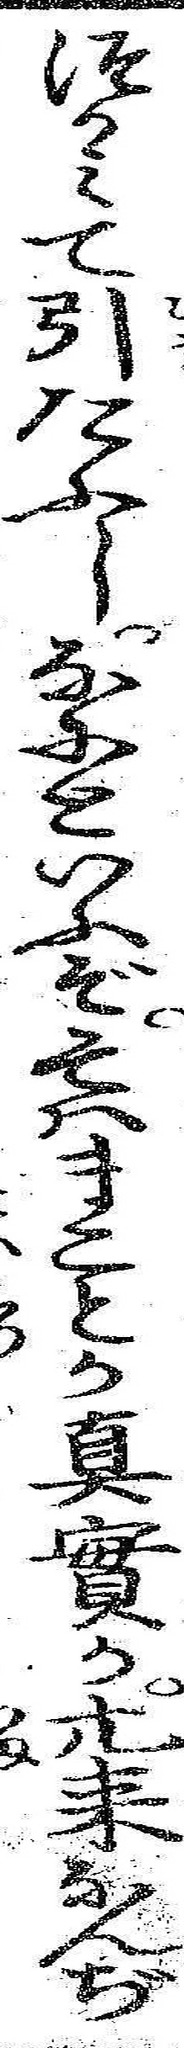つかみて引たふし。なにといふぞ。そはまことか真実か。元来なんぢ
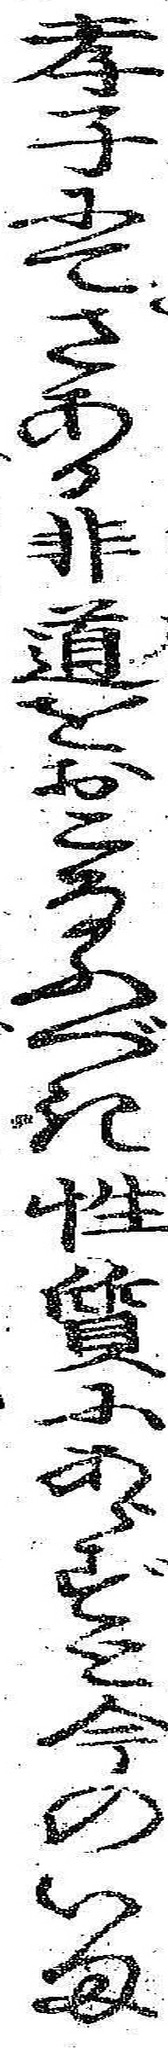孝子にて。さある非道をおこなふべき性質にあらずと。今のいま
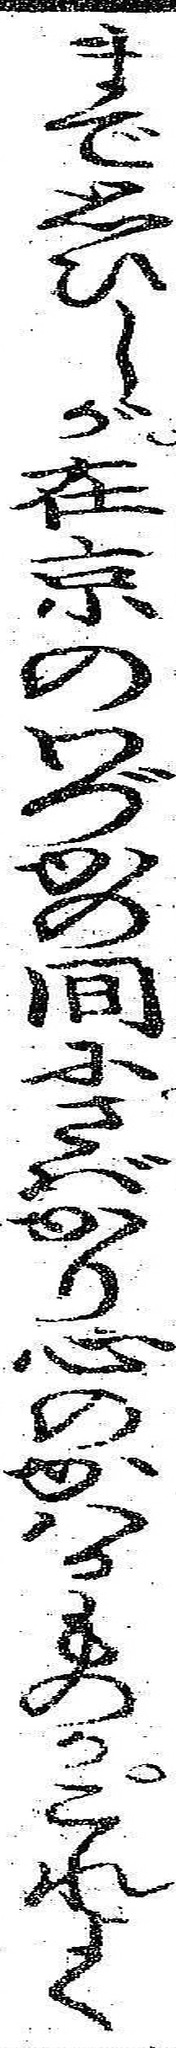まで思ひしが。在京のわづかの間に。さばかり心のかはるものか。これよく

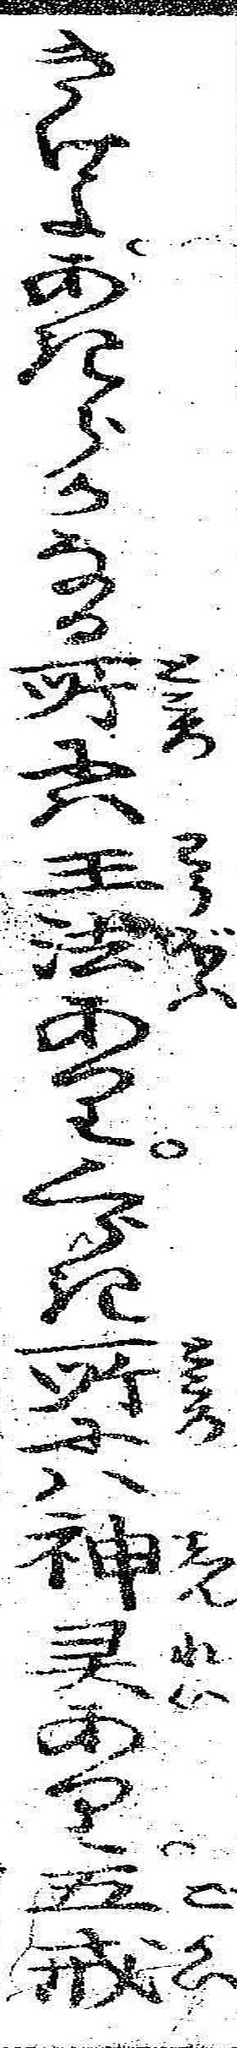きけよ。あきらかなる所には王法あり。くらき所には神霊あり。五戒
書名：昔話稲妻表紙
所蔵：国文学研究資料館
